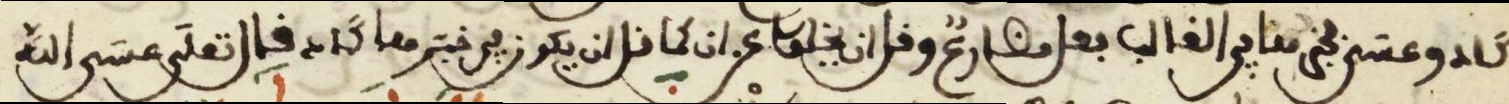كاد و عسى بخبر مغاير القالب فعل مضارع و قل ان يخلق عن ان كما قل ان يكون في خبر معا كاد قال تعالى عسى الله
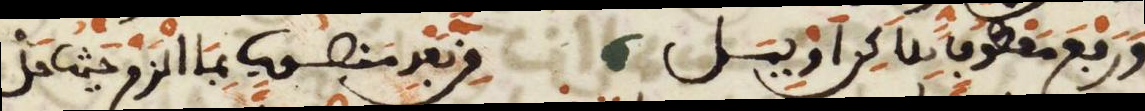وف بلاكن اويمل ٠٠٠ من بعد منصوب بما الزم حيث حل
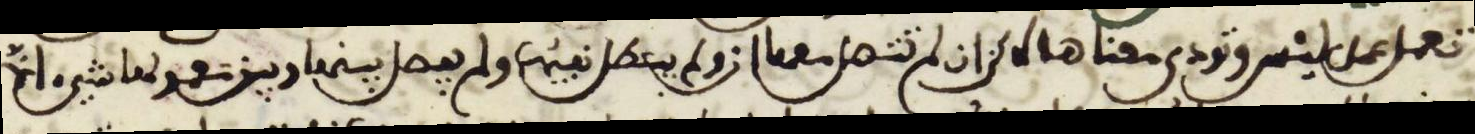تعمل عمل ليس و تودى معناها #كن ان لم تتصل معها ان و لم يبطل نفيها ولم يفصل بينهما و بين مهد لها شيء انه
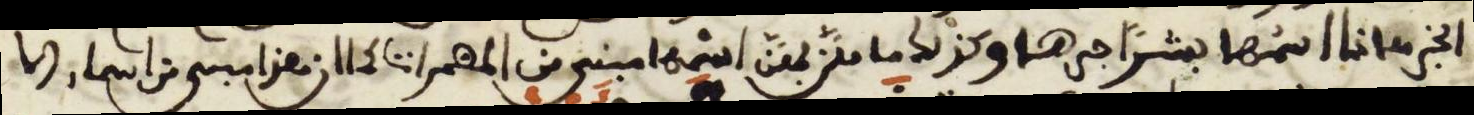النجرمعانا اسمها بشرا حبر ها و كن لك ما معن بطعن اسمها مبنى من المضمرات كما ان معزا مبسى من اسمها الا
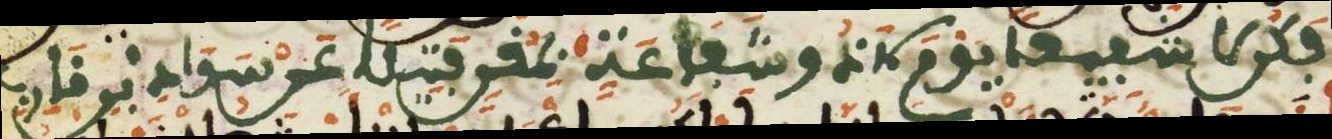٠ فكن لا شفيعا يوم لا ذ و شفاعة بمقن فتيلا عن سواد بن قارب
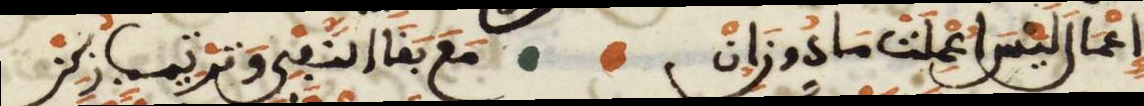إعمال ليس اعملت ما دون إن ٠٠٠مع بقا النفى و ترتيب زكن
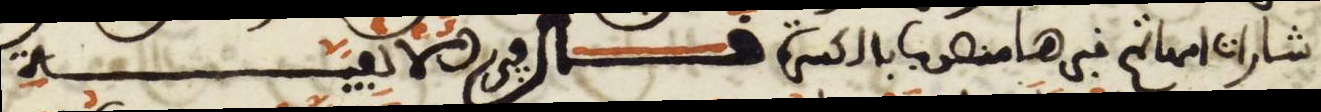شارات امهاتهم خبرها منصرب بالكسرة قال في الالفية
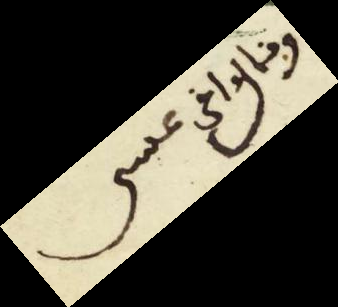و قالوا فى عيسى
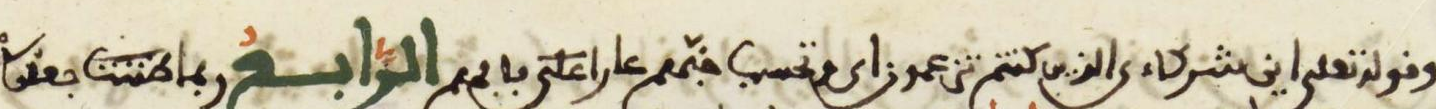و قوله تعلى اين شركاء عن الذي كنتم تزعمون أي و تحسب جنهم عارا على با بهم الرابح ربما ظننت جعم#
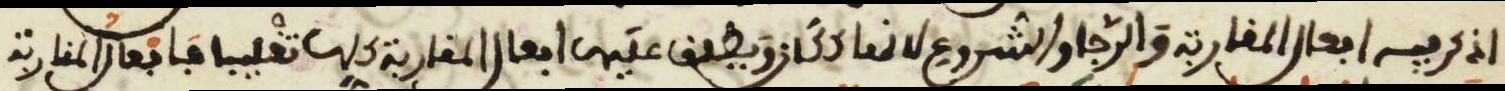اذكر فيه افعال المقاربة و الرجا و الشروع لانها ككان و يطلق عليها أفعال المقاربة كلها تغليبا فافعال المقاربة
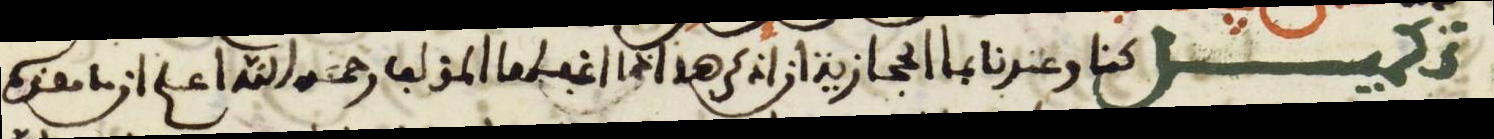تكميل كنا وعندنا بما الحجازية ان اذكرها اذا اغفا ها المؤلف رحمه الله اعلم ان ما #
